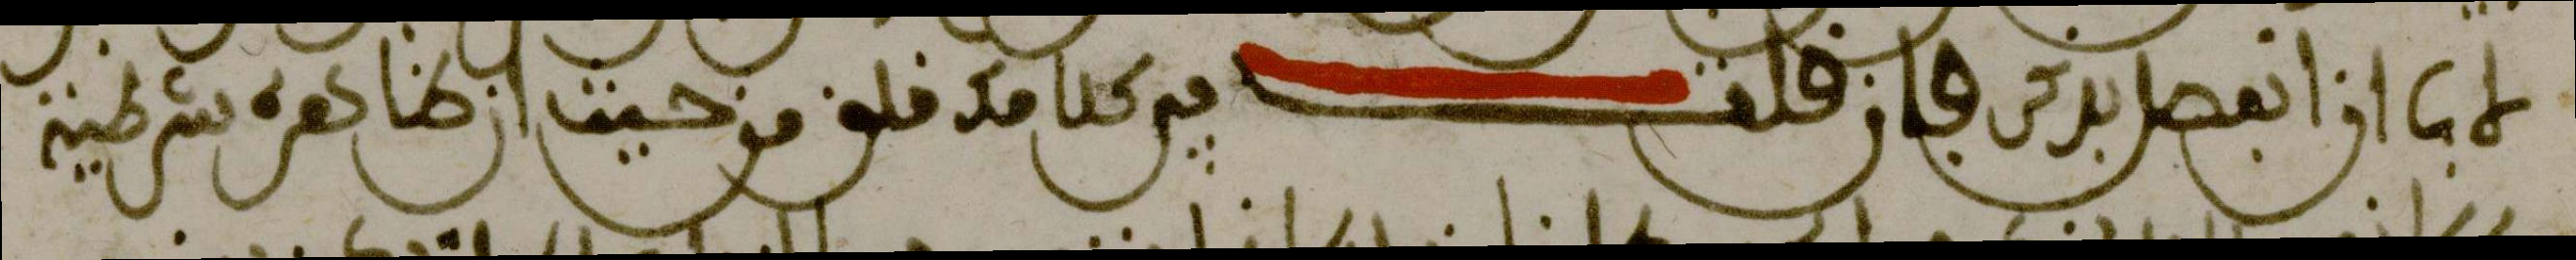لاب ان انفصل بذكر فان قلت في كلامك قلق من حيث ان ظاهره شرطية
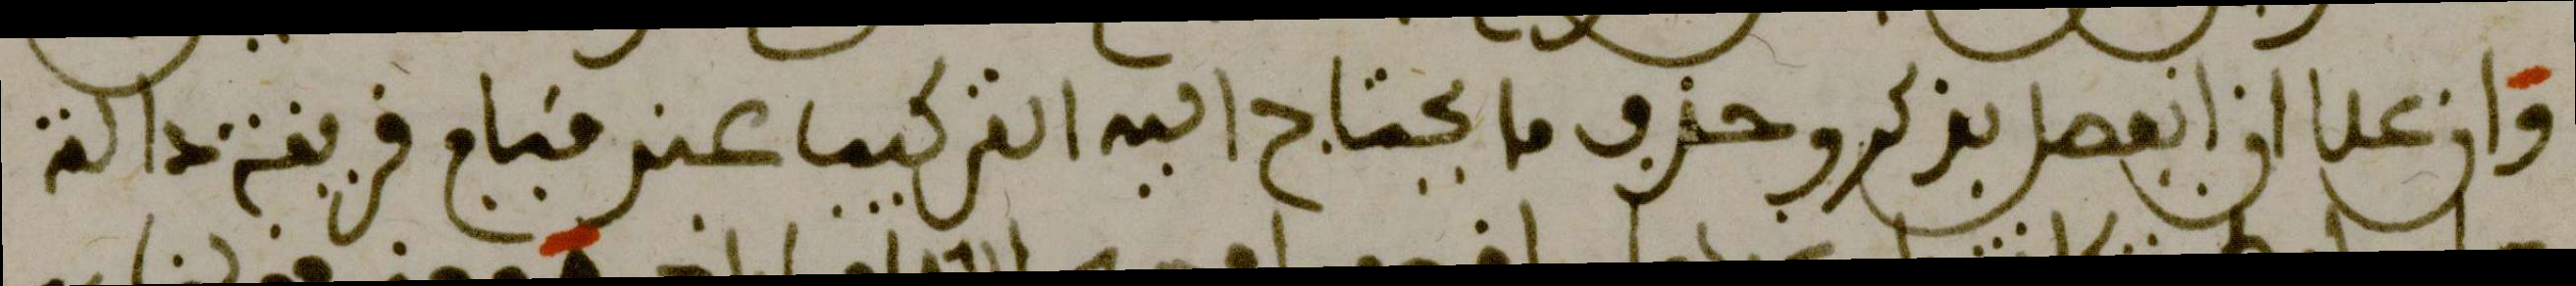وان علا ان انفصل بذكر وحذف ما يحتاج اليه التركيب عند قيام قرينة دالت
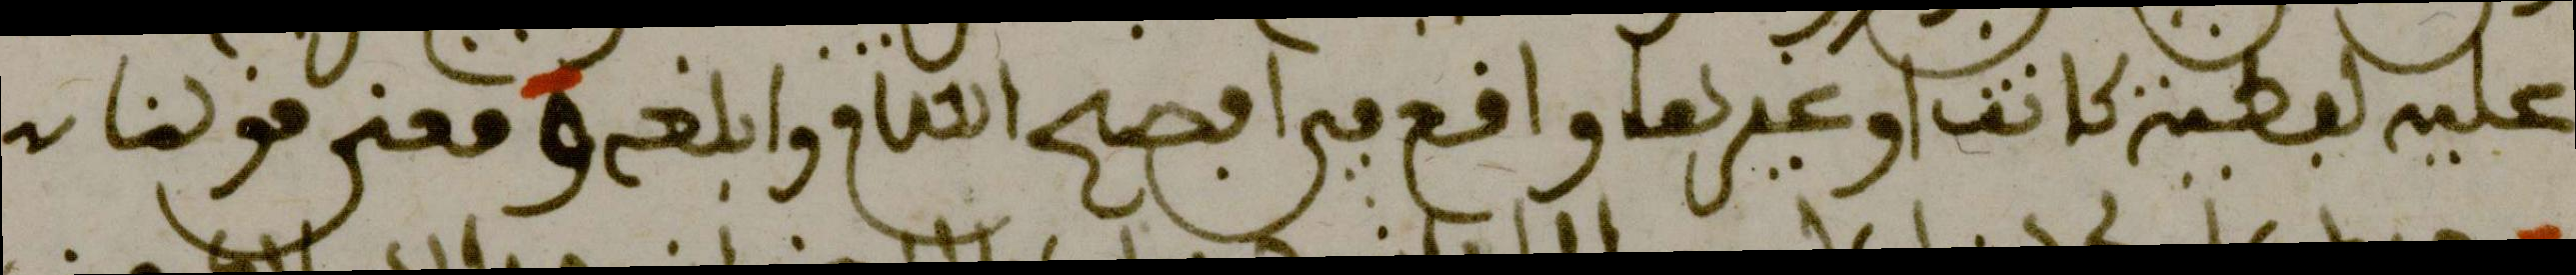عليه لفظية كانت او غيرها واقع في افصح الكلام وابلغه ومعنى قولنا
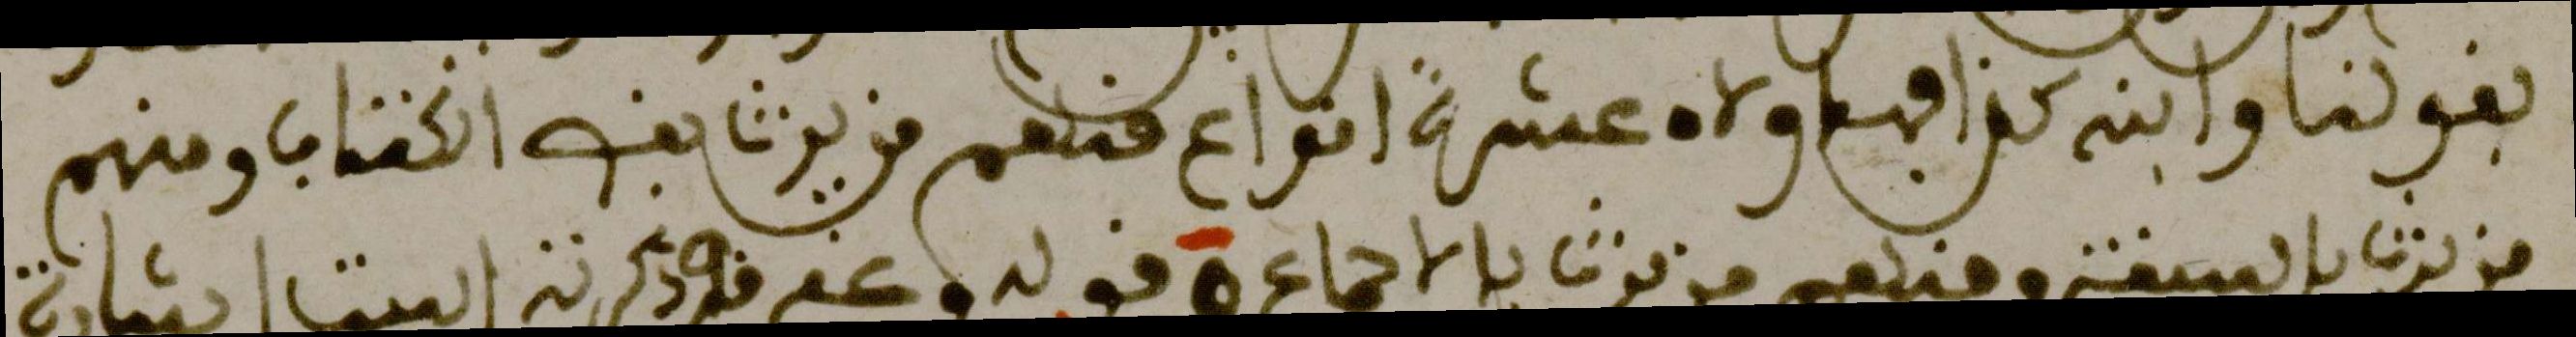بقولنا وابنه كذا فهاولاء عشرة انواع منهم من يرث بنص الكتاب ومنهم
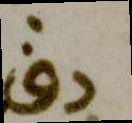دق
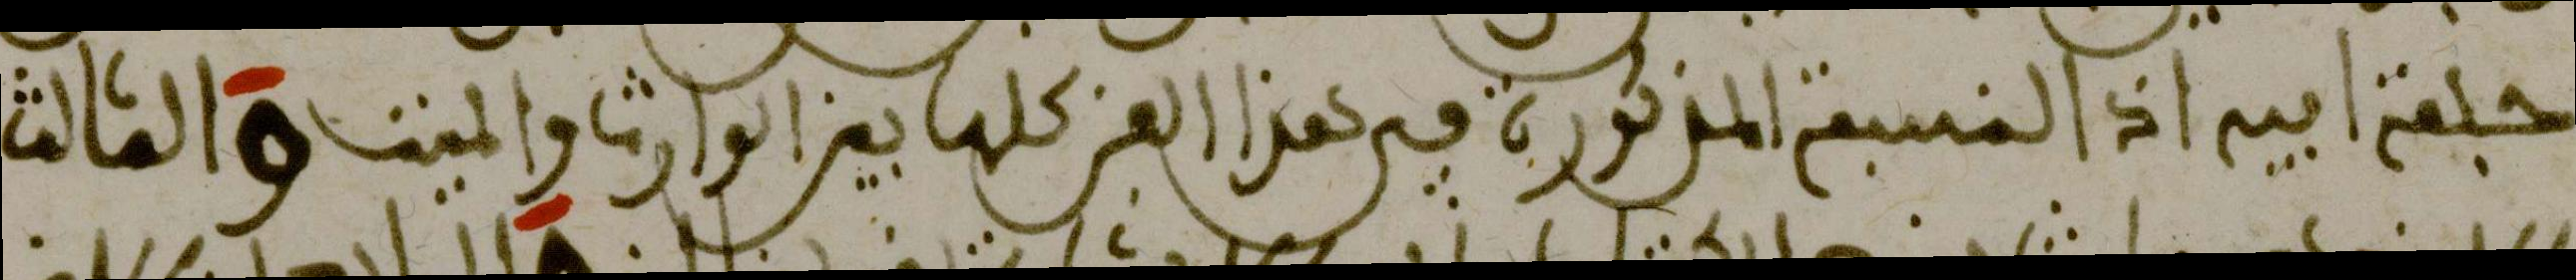جهة ابيه اذ النسبة المذكورة في هذا الفن كلها بين الوارث والميت والثالث
